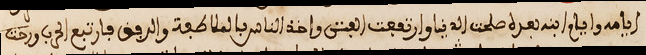ايامه وايام ابنه بعده صلحت الدنيا وارتفعت الفتن واخذ الناس بالملاطفة والرفق فارتبع الحرب ورخت
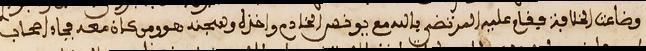وضاعت الخلافة فقام عليه المرتضى بالله مع يونس الخادم واخذه وسجنه هو ومن كان معه فجاء اصحاب
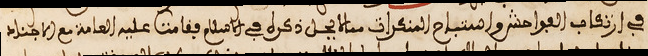في ارتكاب الفواحش واستباح المنكرات ممالا بجل ذكره في الاسلام فقامت عليه العامة مع الاجناد
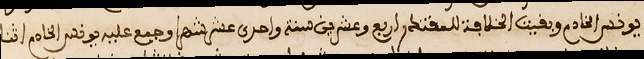يونس الخادم وبقيت الخلافة للمقتدر اربع وعشرين سنة واحدى عشر شهرا وجمع عليه يونس الخادم اثنا
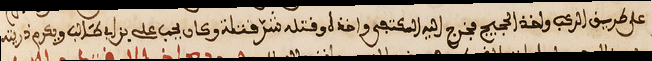على طريق الركب واخذ الحجيج فخرج اليه المكتفى واخذه وقتله شر قتلة وكان يحب على بن ابى طالب ويكرم ذريته
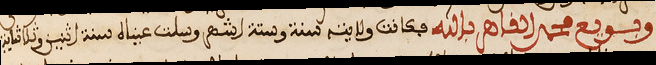وبويع محمد القاهر بالله فكانت ولايته سنة وستة اشهر وسلت عيناه سنة اثنين وثلاثماية
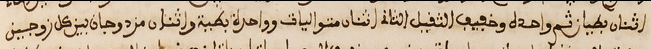اثنان بطيان ثم واحده وخفيف الثقيل الثانى اثنان متو اليات وواحدة بطية واثنان مزد وجان بين كل زوجين
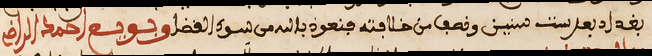بغداد بعد ست سنين ونصف من خلافته فنعود بالله م سوك القضا وبويع احمد الراضى
